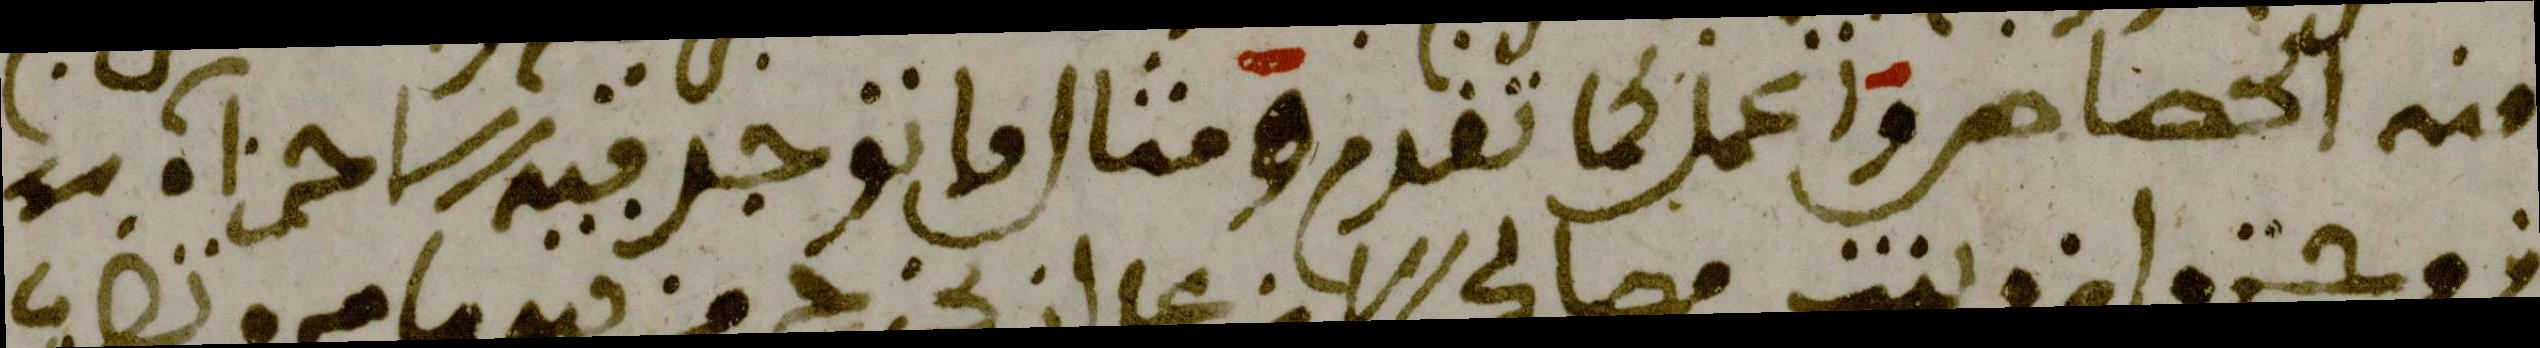منه الحصاص وَاعمل كما تقدم وَمثال ما توجد فيه الاجزاء
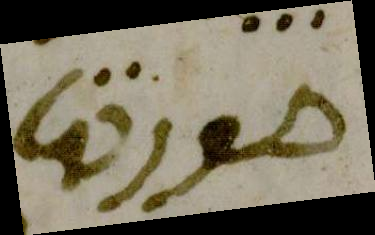صورتها
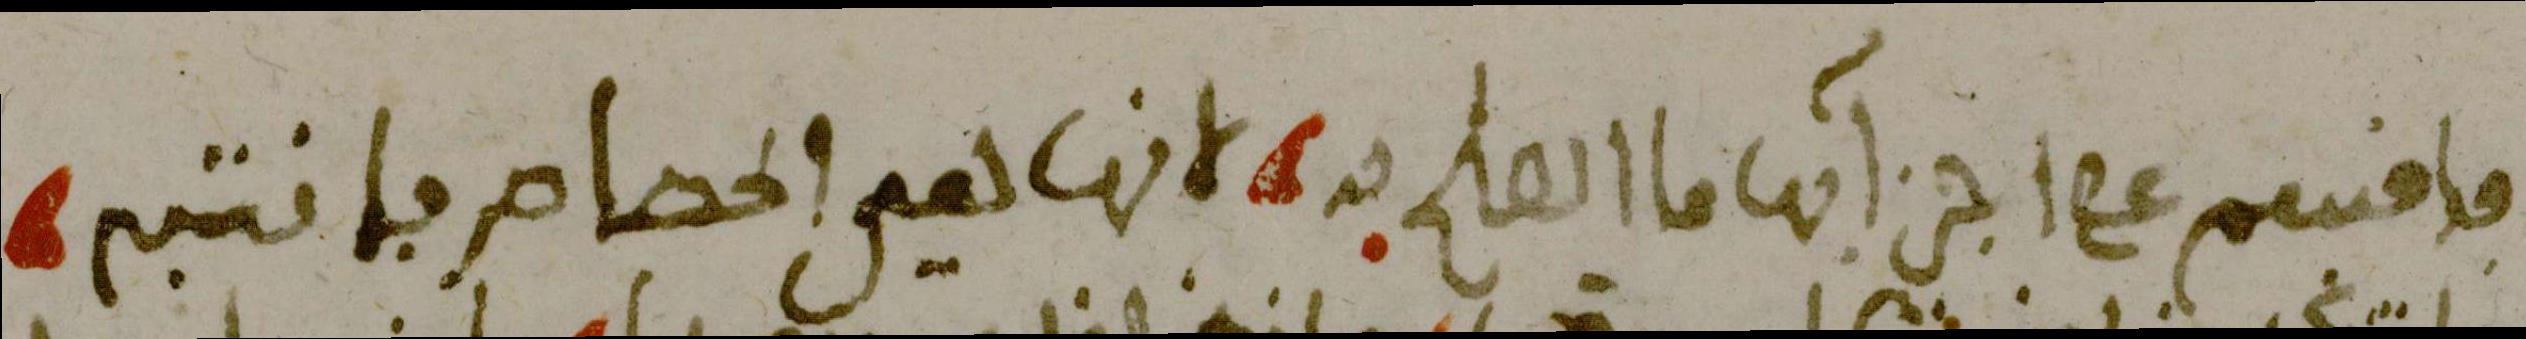فاقسم على اجزائها ما الصلح له لانها هي الحصاص فانتبه
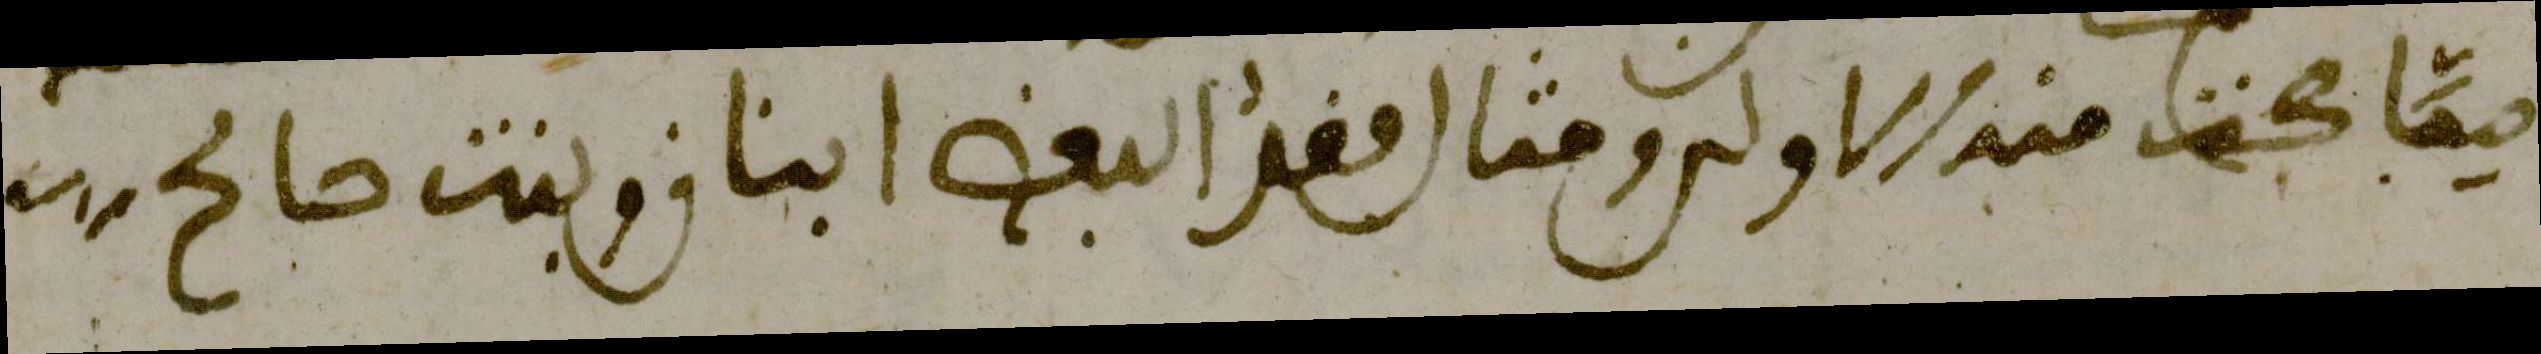مِمّا صحت منه الاولى ومثال فقدد البعض ابنان وبنت صالح
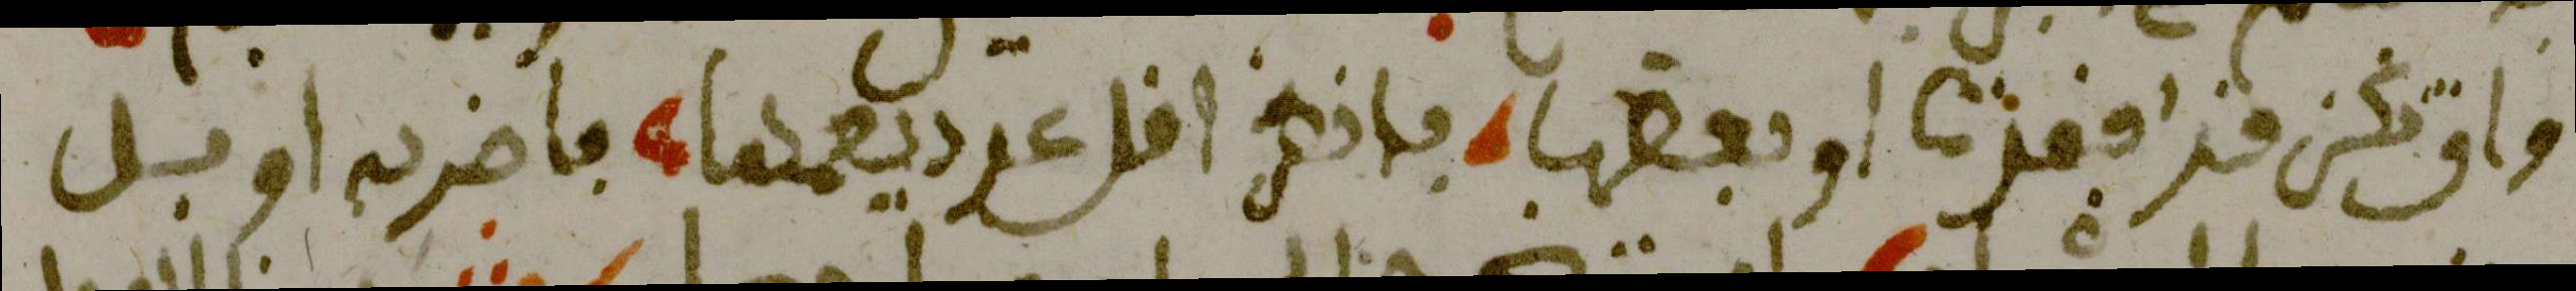وان تكن قد فقدت او بعضها فانظر اقل عدد يعمها فاضربه او بل
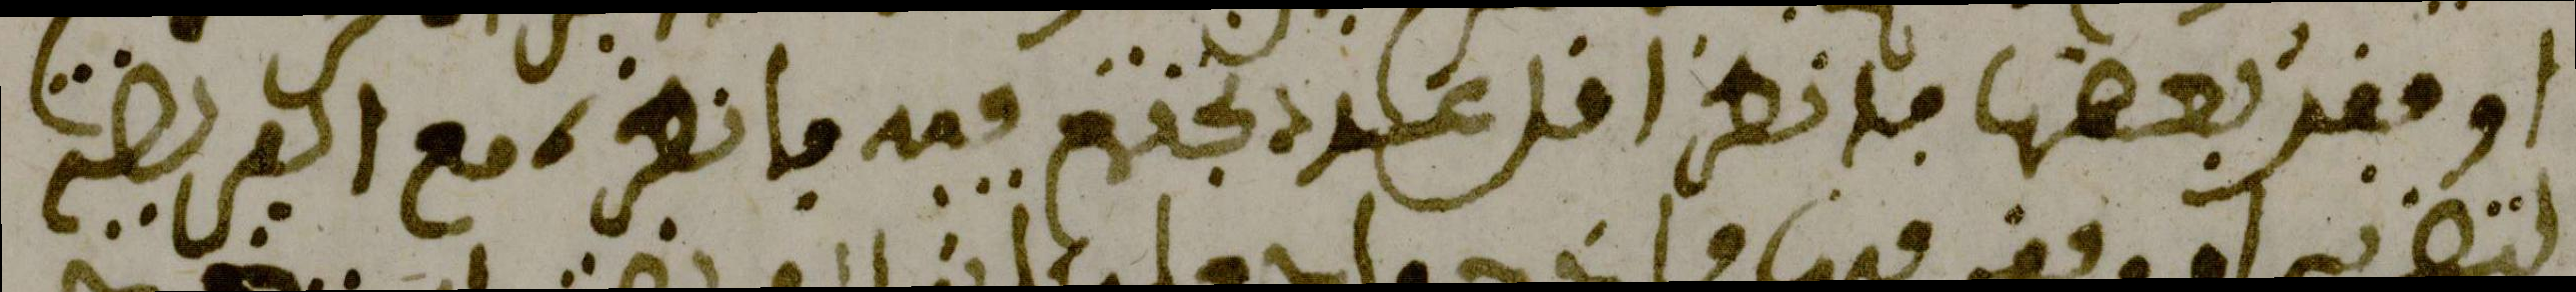او فقد بعضها فانظر اقل عدد تجتمع فيه فانظره مع الفريضة
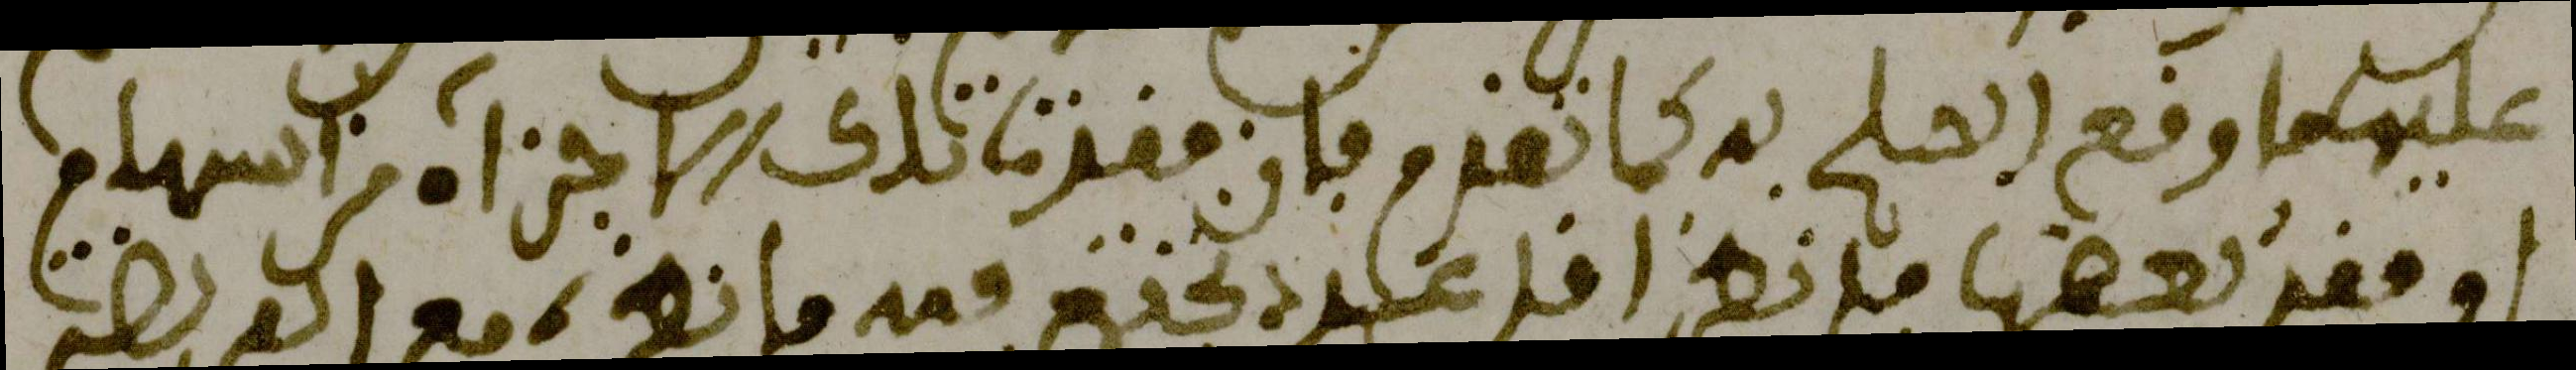عليها ما وقع الصلح به كما تقدم فان فقدت تلك الاجزاء من السهام
